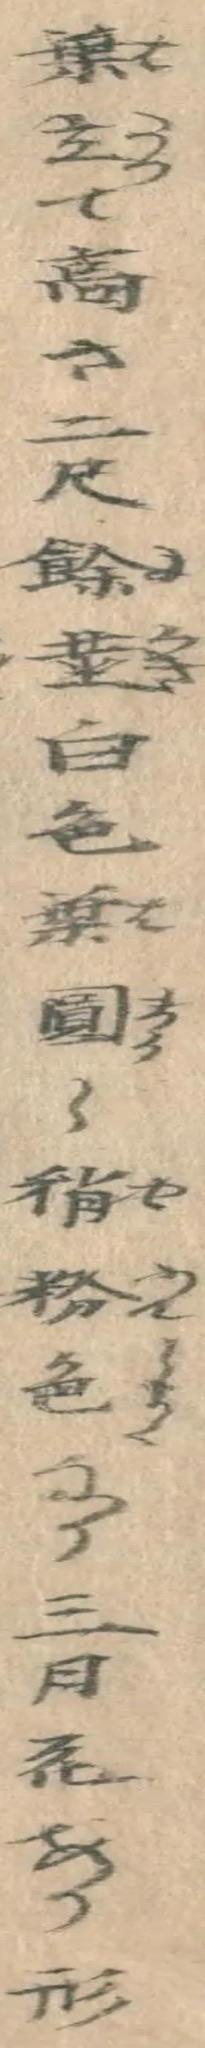葉立て高さ二尺余茎白色葉円し稍粉色なり三月花あり形
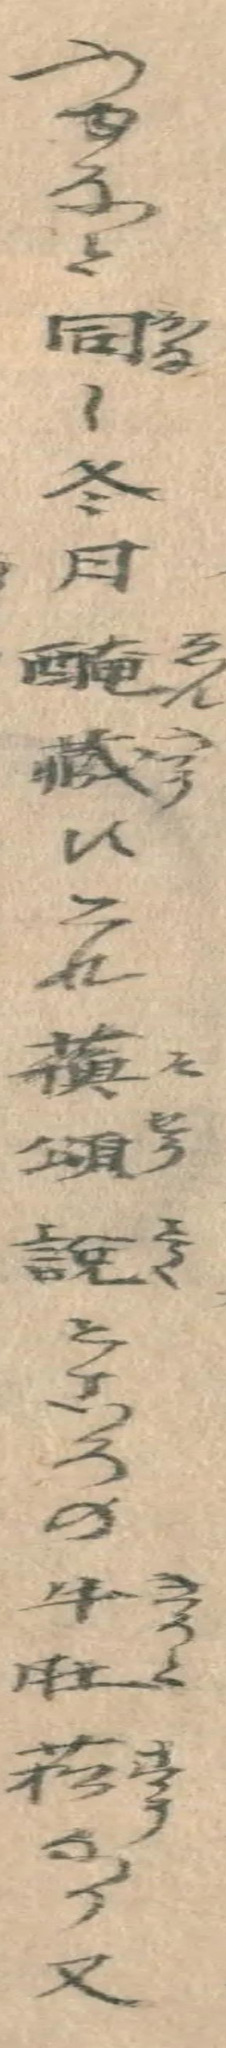ふゆなと同し冬月醃蔵すこれ蘇頌説ところの牛肚菘なり又
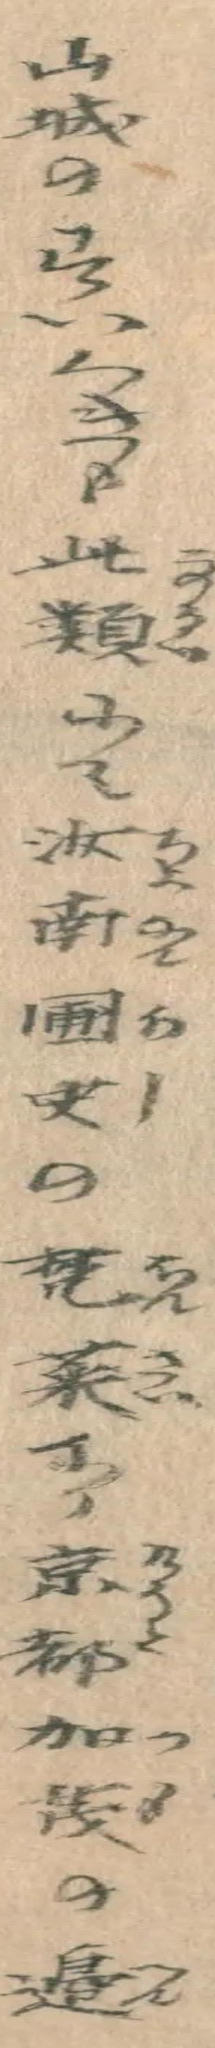山城のすいくきも此類にて汝南圃史の梵菜なり京都加茂の辺
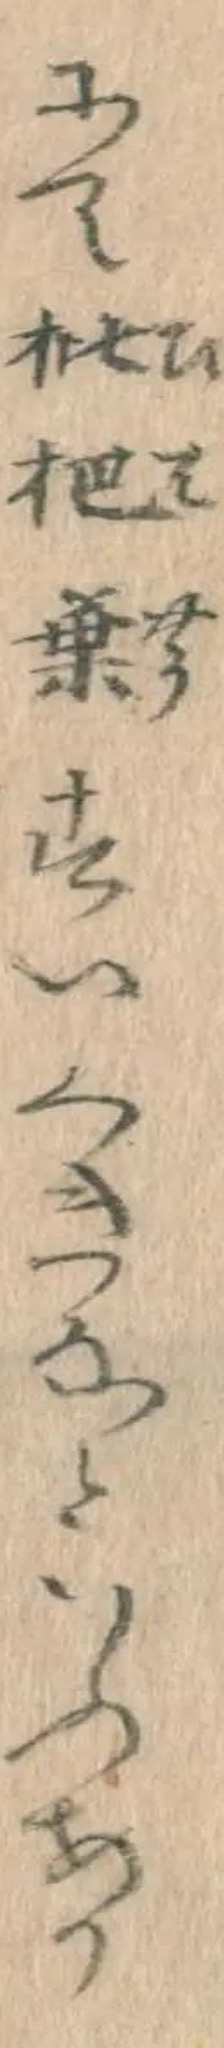にて枇杷葉すいくきなといふあり
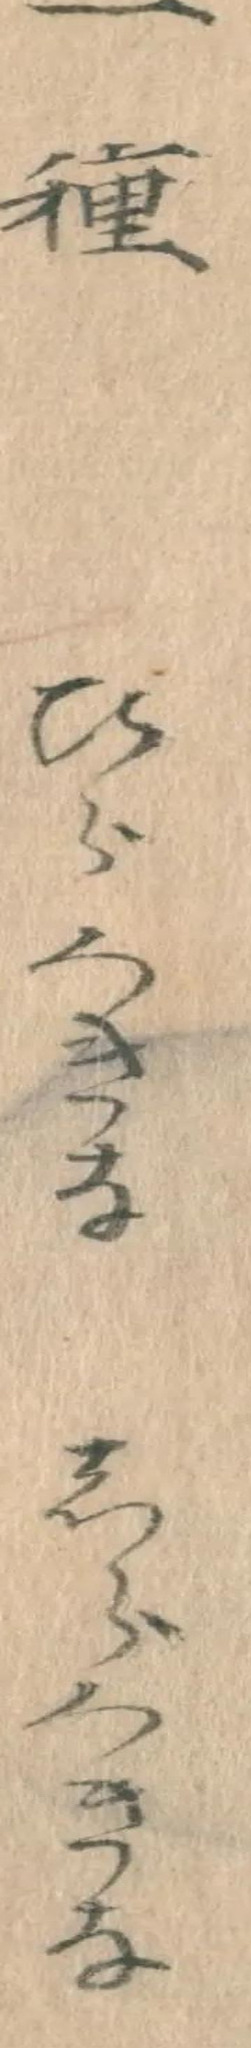一種ひらくきなしらくきな
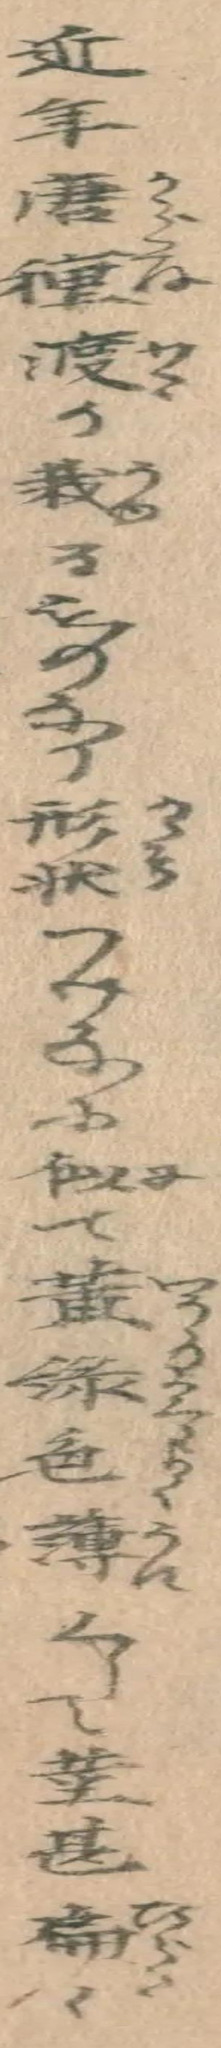近年唐種渡り栽るものなり形状つけなに似て黄緑色薄くして茎甚扁く
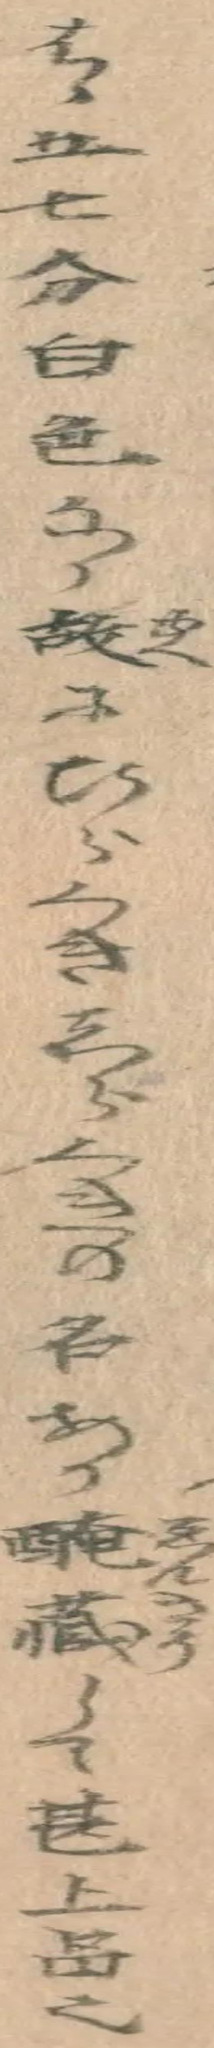はゝ五七分白色なり故にひらくきしらくきの名あり醃蔵して甚上品也
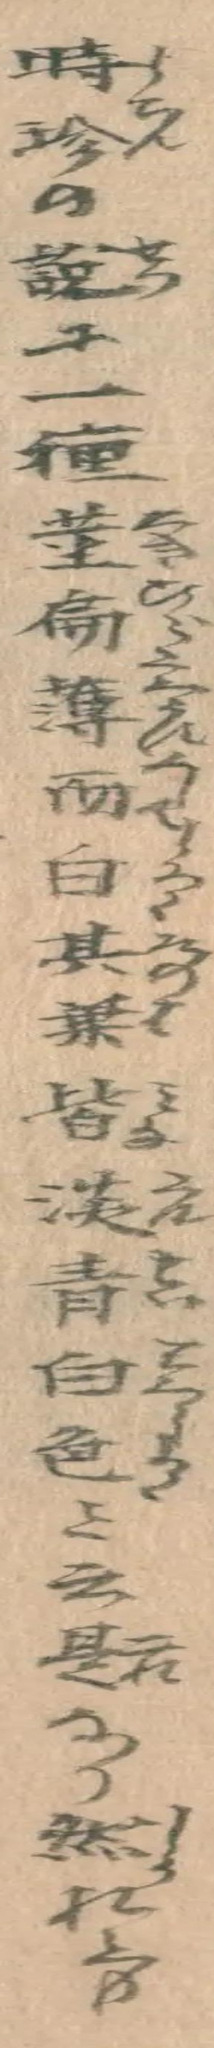時珍の説に一種茎扁薄而白其葉皆淡青白色と云是なり然れとも
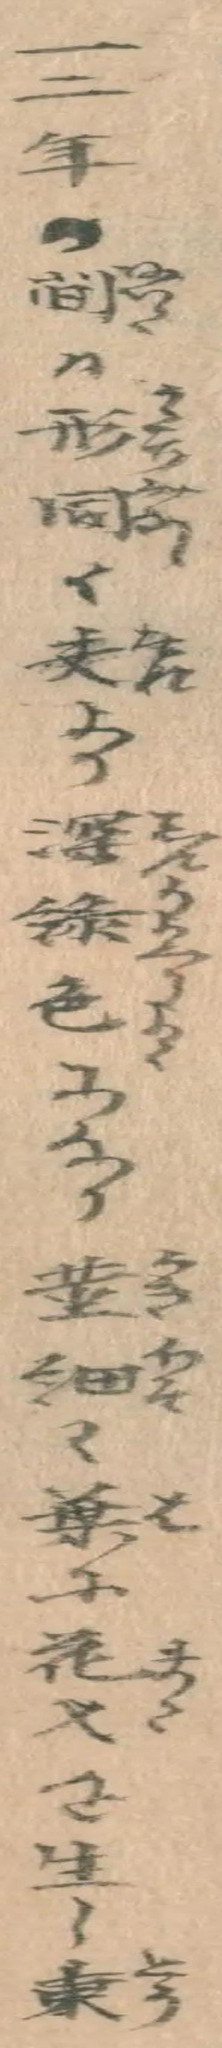一二年の間は形同く夫より深緑色になり茎細く葉に花叉を生し東
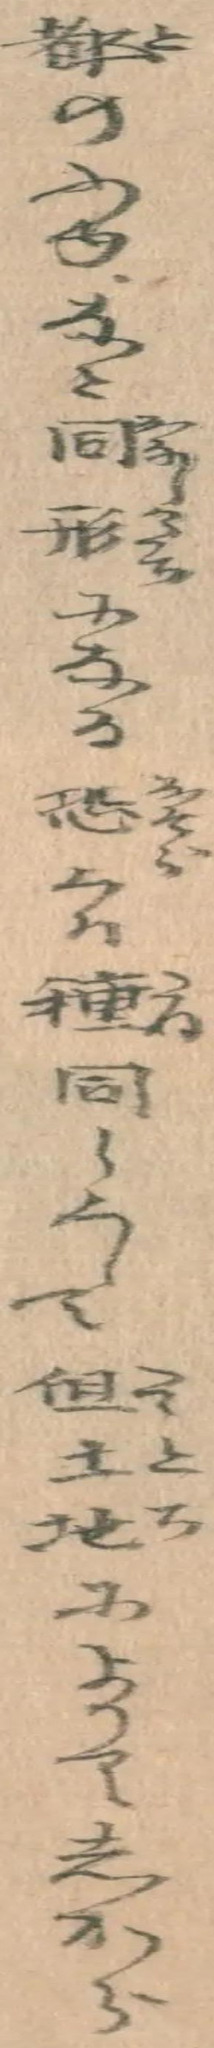都のふゆなと同形になる恐くは種同しくして但土地によりてしから
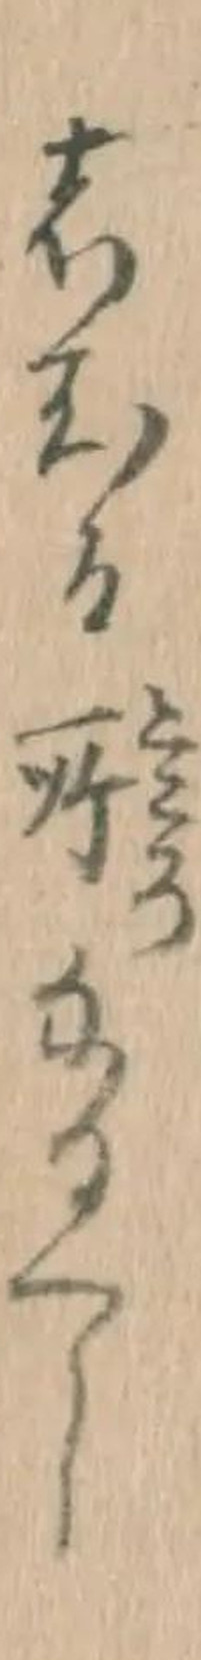しむる所なるへし
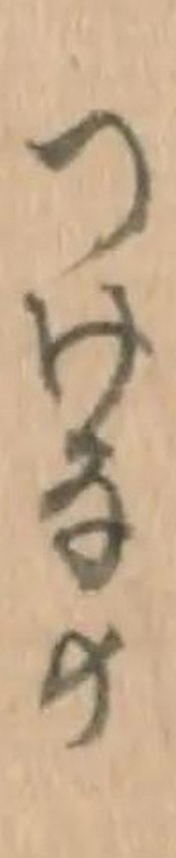つけなの
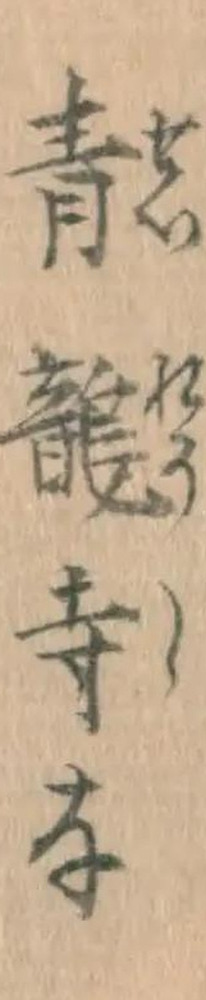青竜寺な
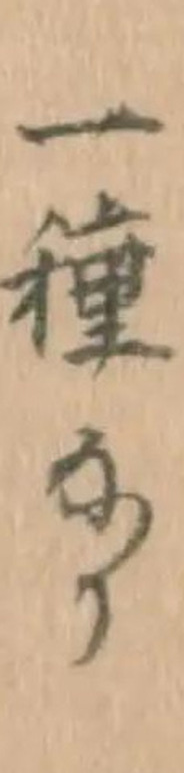一種なり

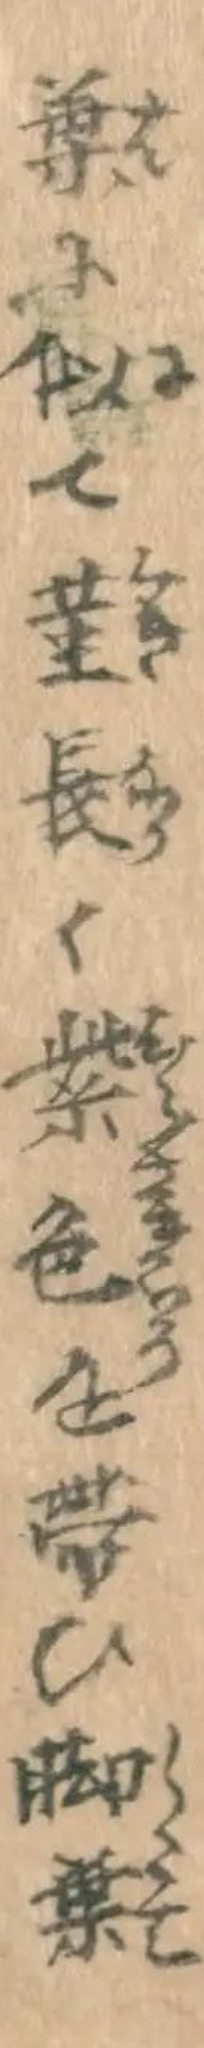葉に似て茎長く紫色を帯ひ脚葉
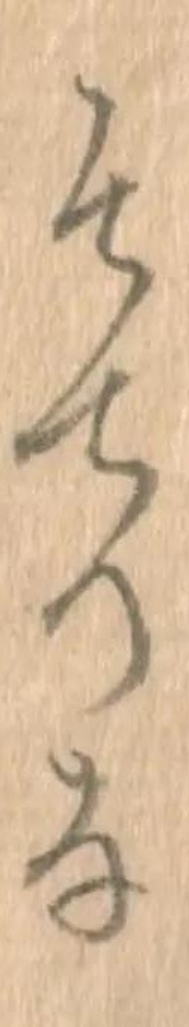そてつな
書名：本草図譜. 巻46-48
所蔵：国立国会図書館 National Diet Library, JAPAN
